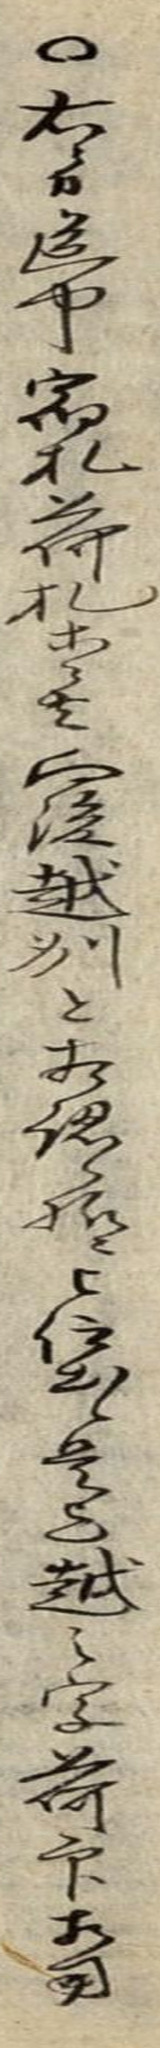○右に付道中宿札荷物等には向後越州と相認候様に被仰出候是迄越之字荷印相用
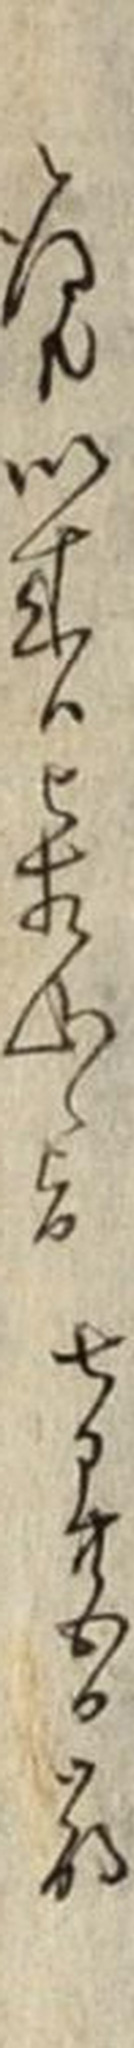候得共以来は被相止候旨七月廿五日御触
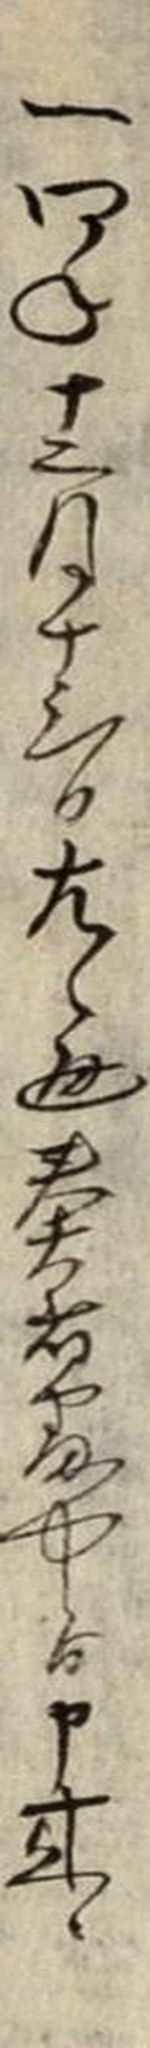一同年十二月十三日左之通奏者番中ゟ申来候
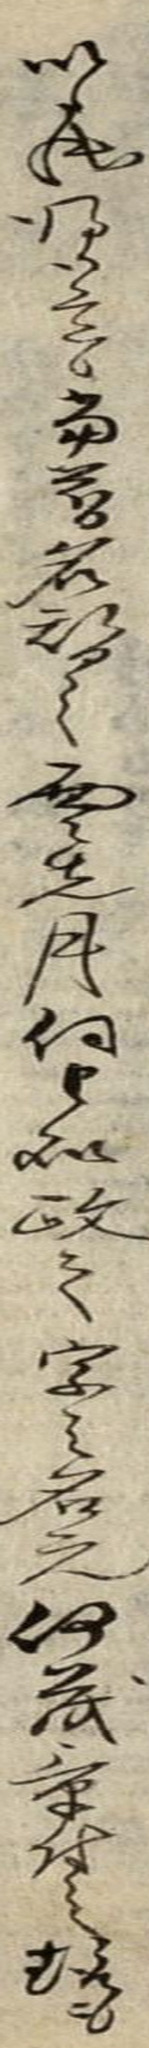以手紙得御意候当暮名替之面々先月伺申候処政之字之名元何も気付候趣も
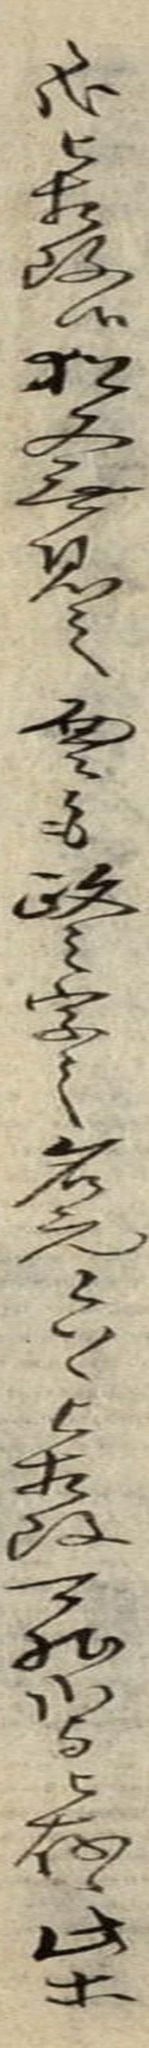候哉被相改候猶又無息之面々へも政之字之名元に候ハゝ被相改可然哉と被存候此等
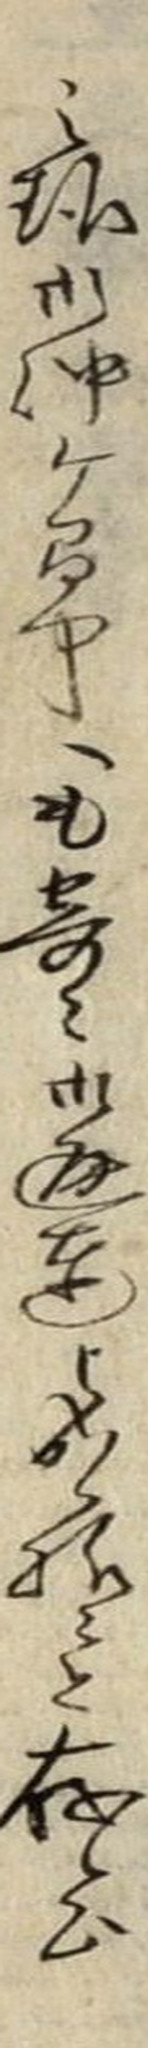之趣御仲ヶ間中へも寄々御通達被成候様にと存候以上
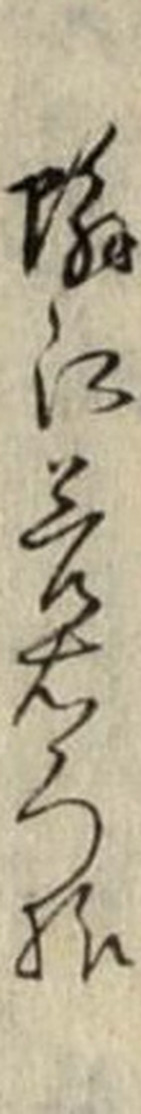蟹江善右衛門様
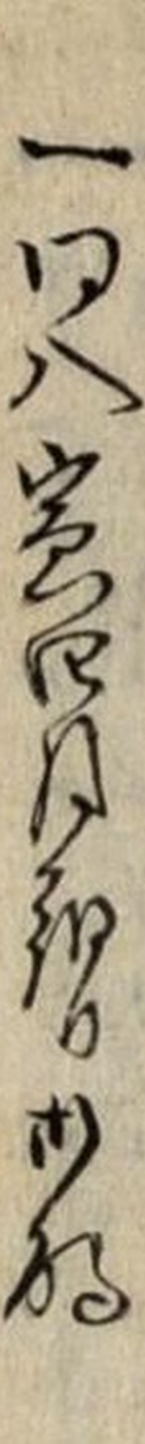一同八寅四月朔日御触
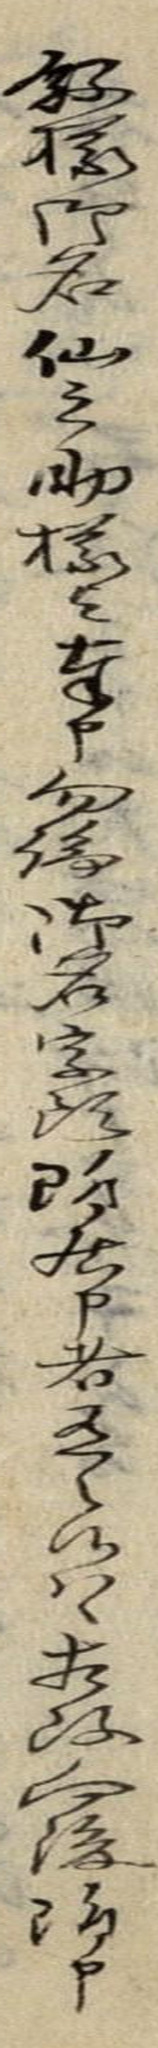殿様御名仙之助様と奉申勿論御名字頭附居申者有之候はゝ相改向後附申
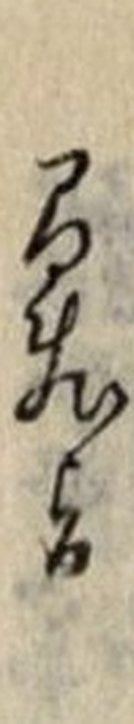間敷旨
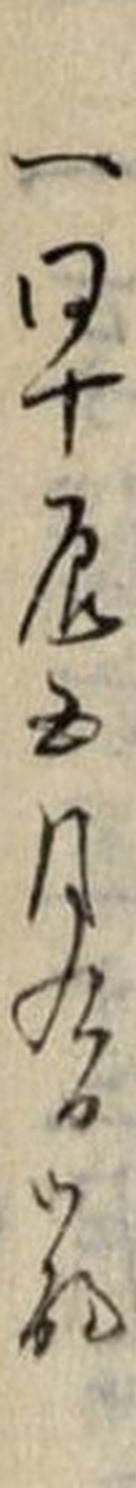一同十辰五月九日御触
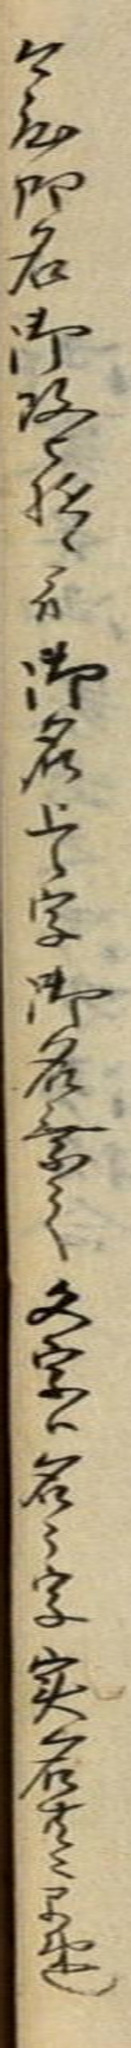今度御名御改被遊候に付御名上之字御名乗之文字は名之字実名共に早速
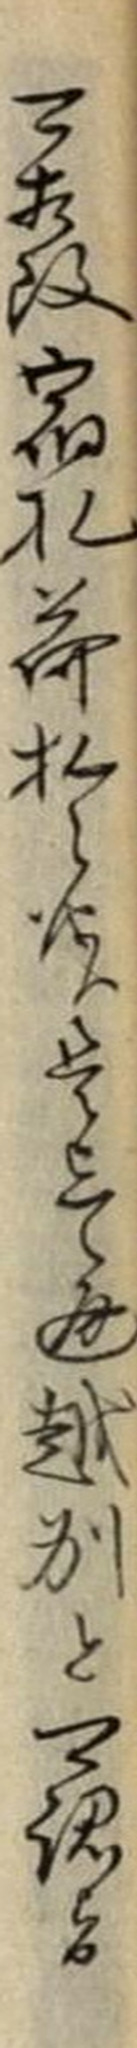可相改宿札荷札之儀は是迄之通越州と可認旨
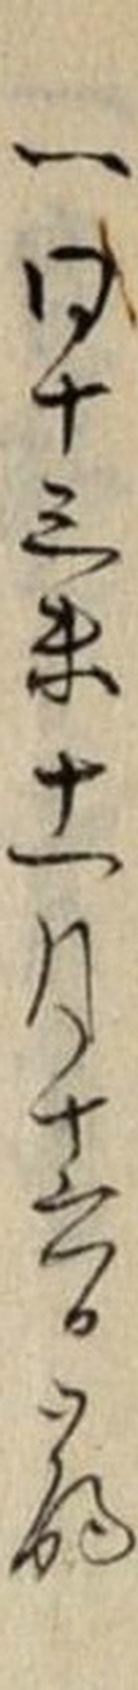一同十三未十一月十六日御触
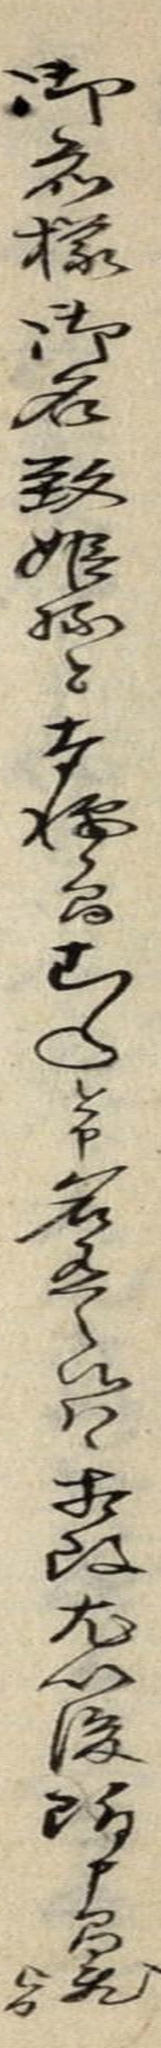御前様御名致姫様と奉称候間むねと申名有之候はゝ相改尤以後附申間敷旨
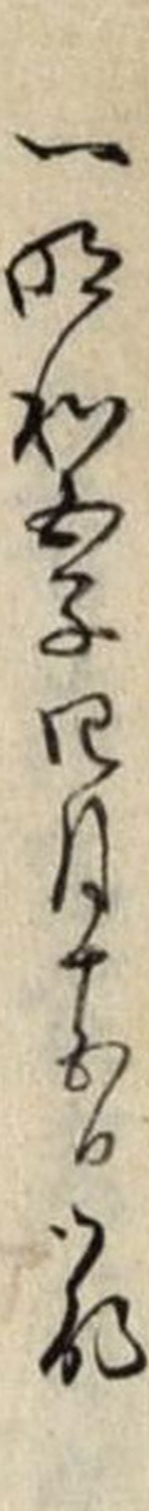一明和五子四月十五日御触
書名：蒐輯之部
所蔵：福井県文書館 Fukui Prefectural Archives
